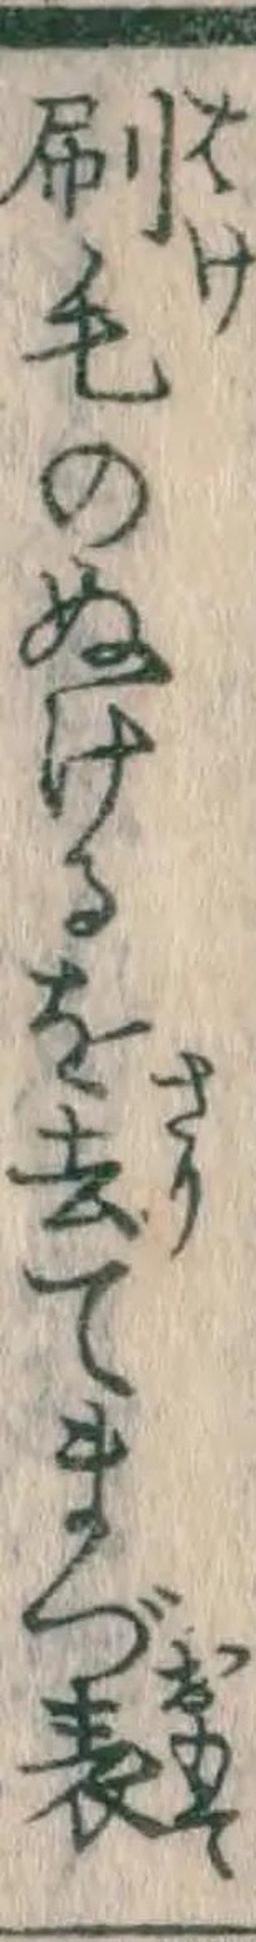刷毛のぬけるを去てまづ表
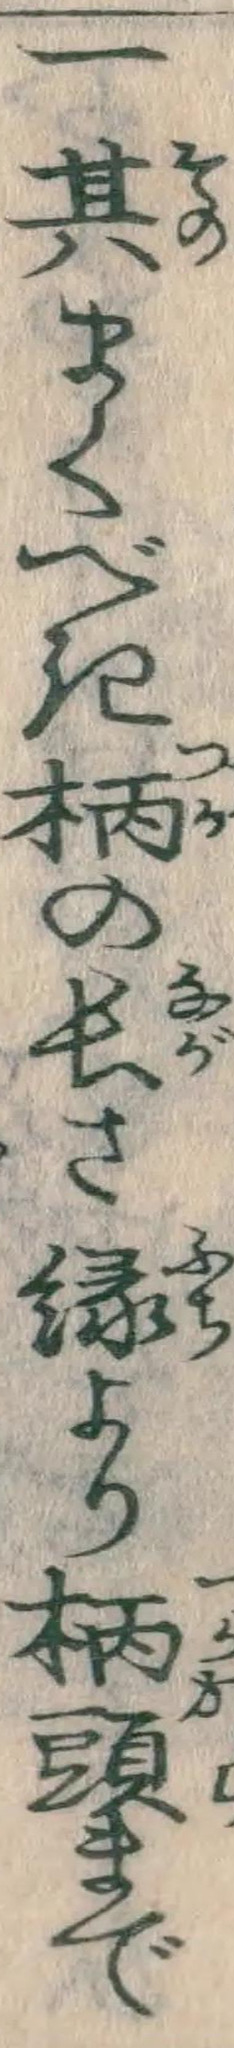一其まくべき柄の長さ緑より柄頭まで
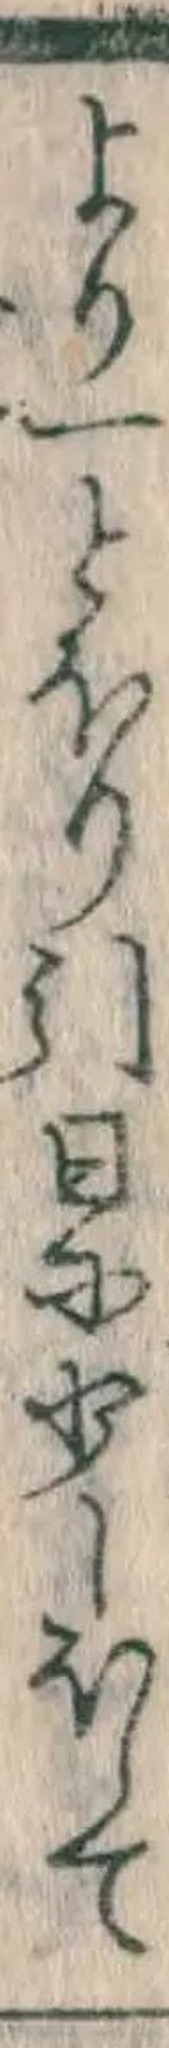より一とほり引日に少しほして
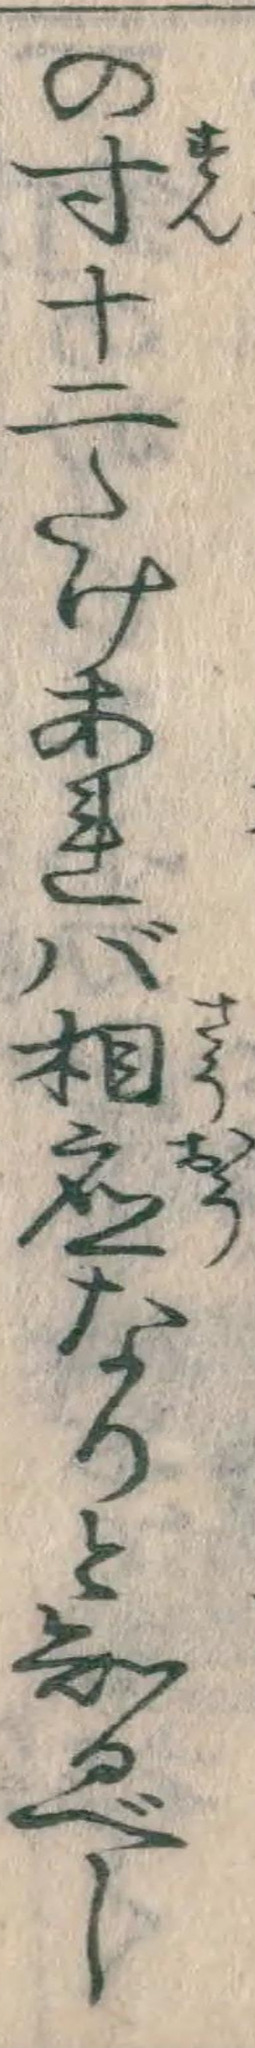の寸十二たけあれば相応なりと知るべし
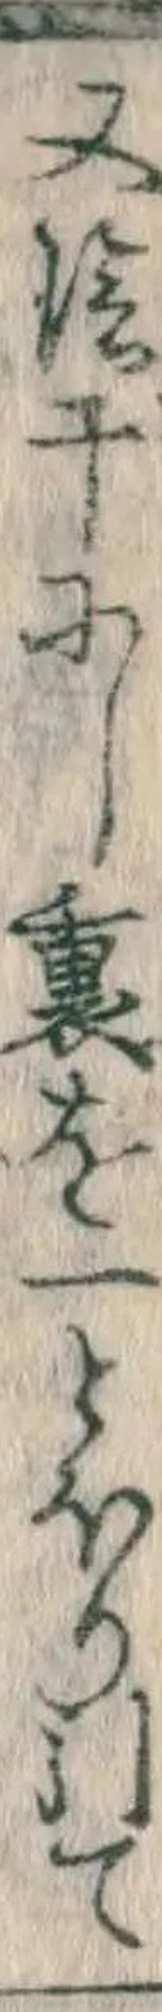又陰干にし裏を一とほり引て
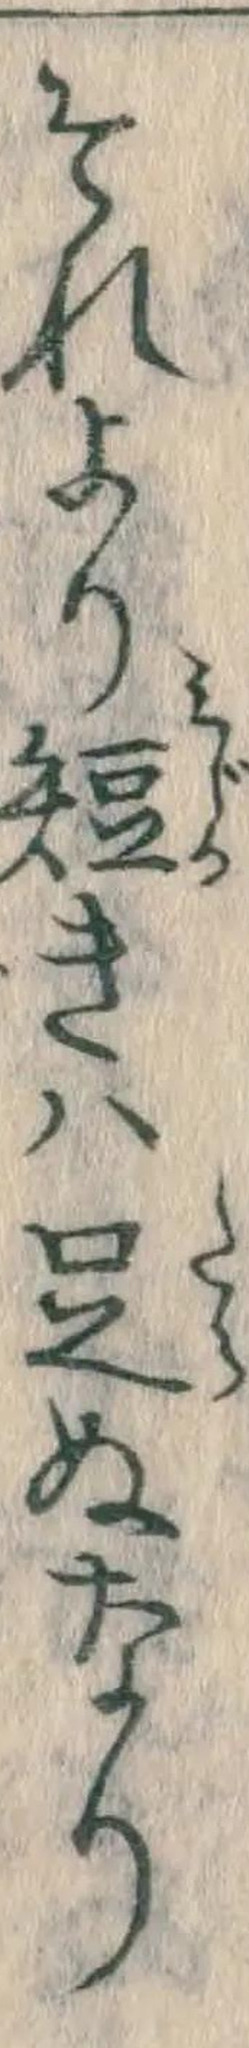それより短きは足ぬなり
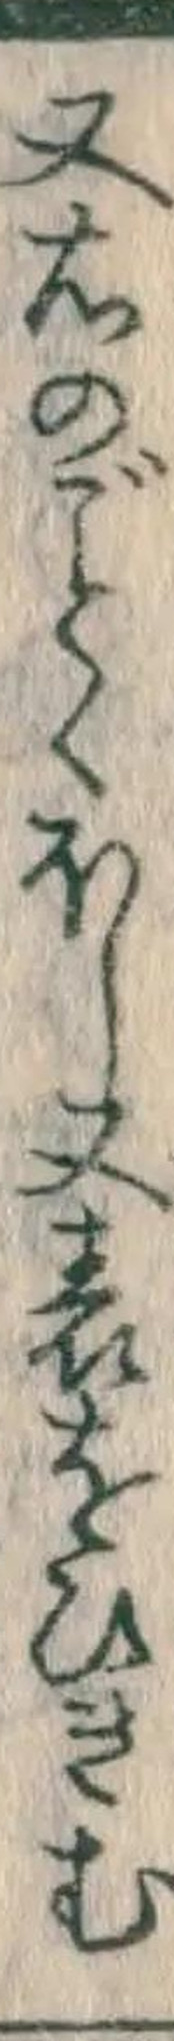又右のごとくほし又表をひきむ
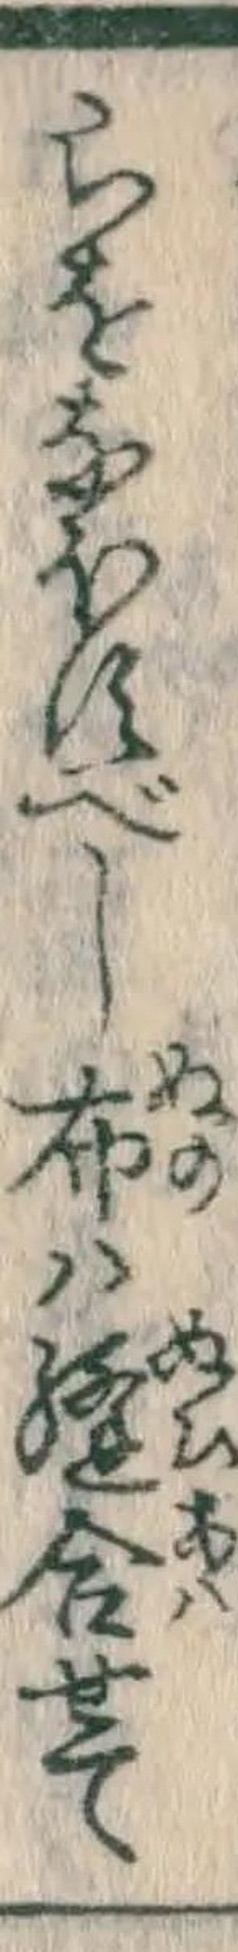らをなほすべし布は縫合せて
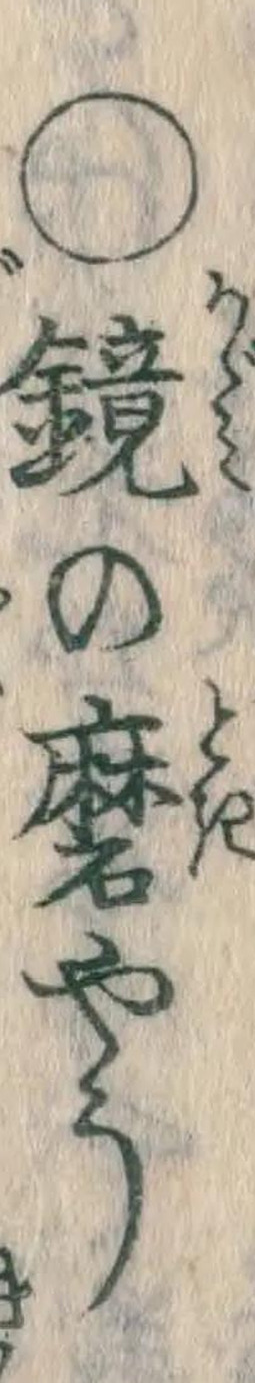○鏡の磨やう
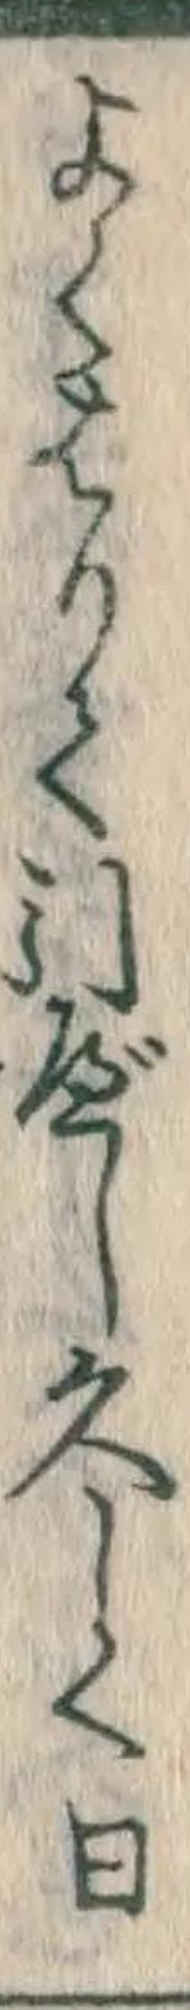よくはりて引べし久しく日
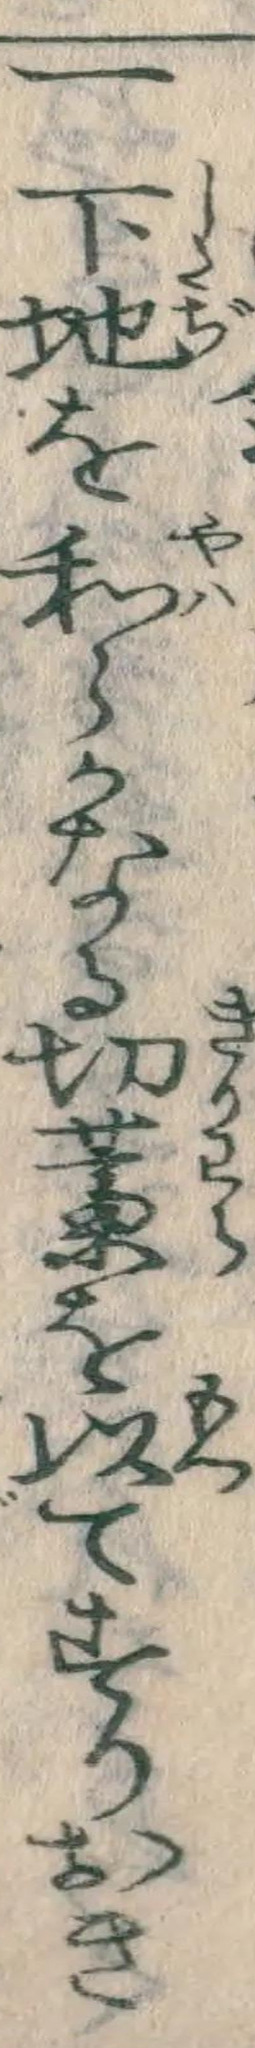一下地を和らかなる切藁を以てすりおき
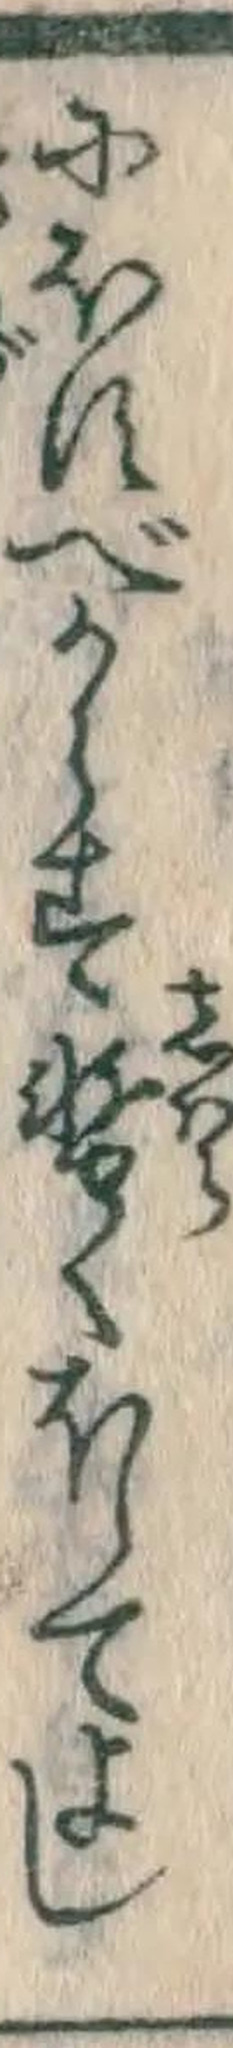にほすべからす暫くほしてよし
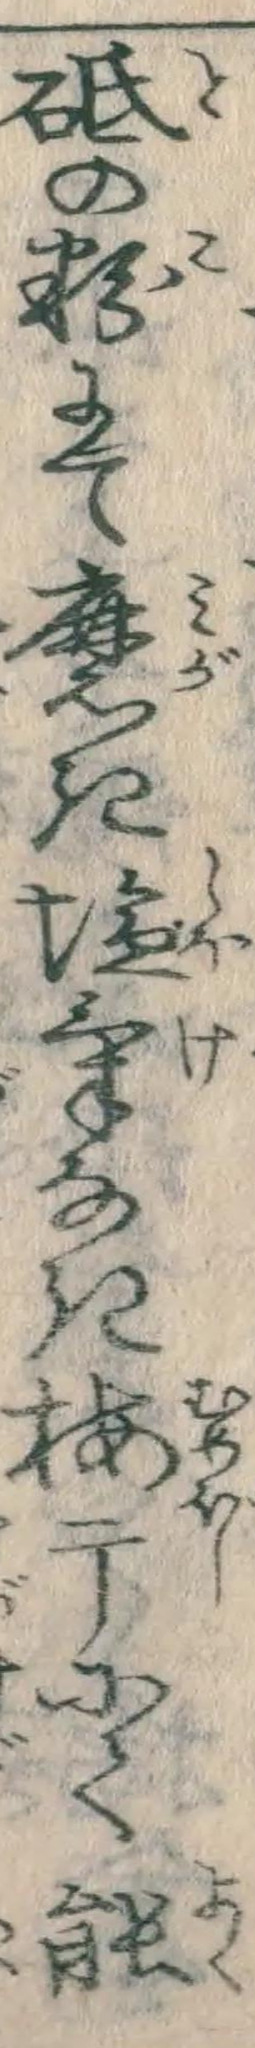砥の粉にて磨き塩気なき梅干にて能
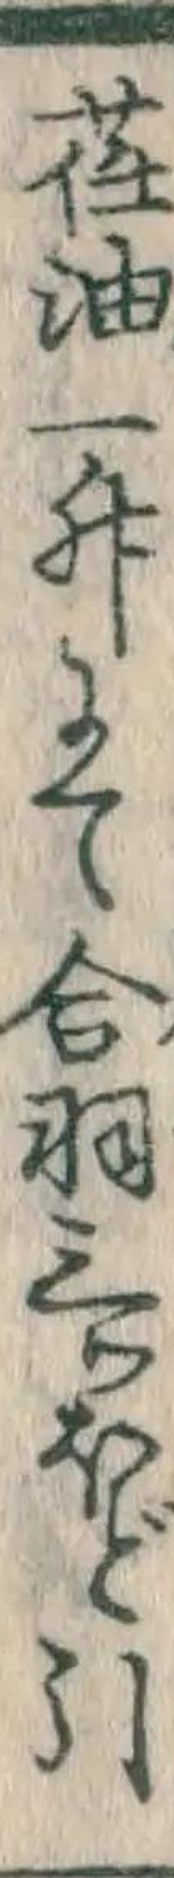荏油一升にて合羽三ッほど引
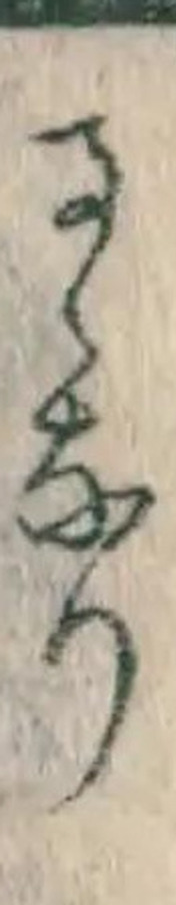るゝなり
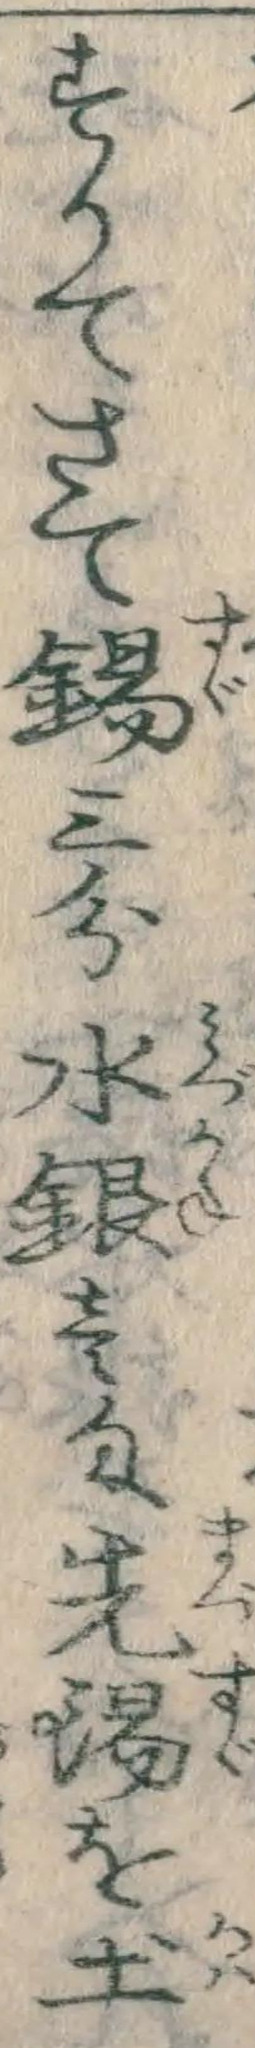すりてさて錫三分水銀壱匁先錫を土
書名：広益秘事大全 3巻. [2]
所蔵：国立国会図書館 National Diet Library, JAPAN
